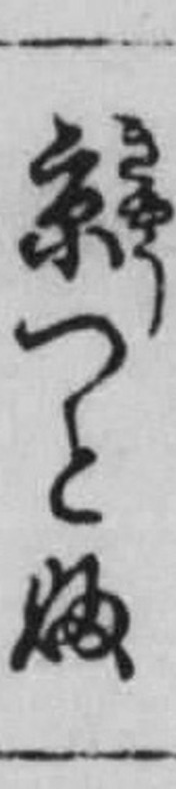京つとふ
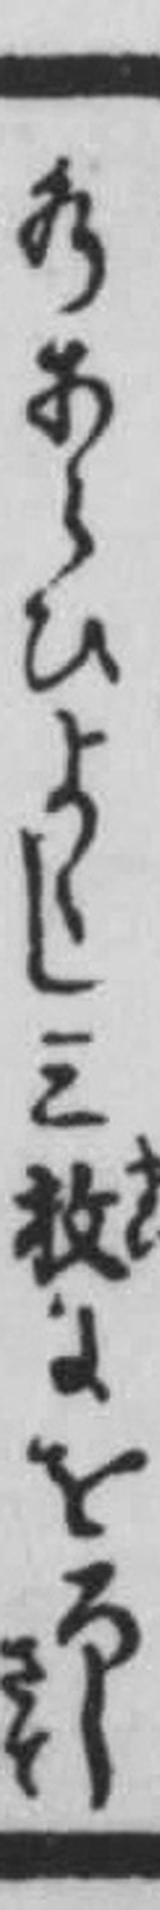水あらひよくし三枚にをろし
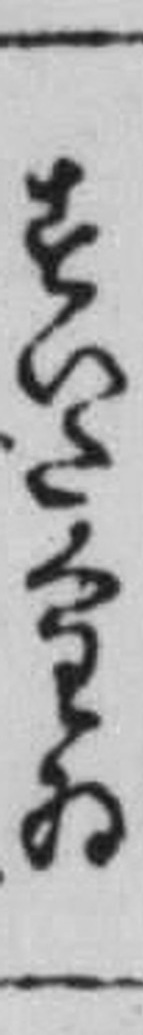すいたくわゐ
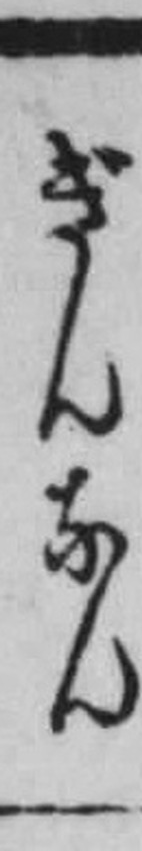ぎんなん
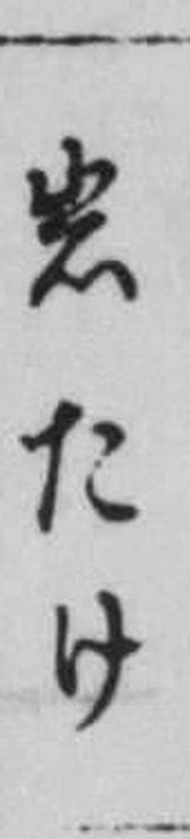岩たけ
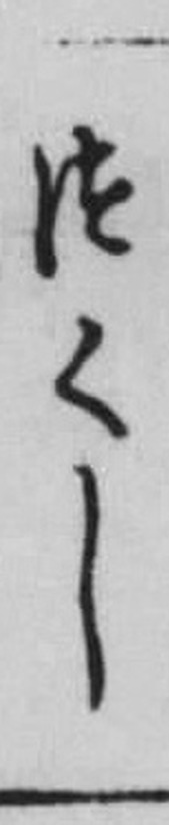つくし
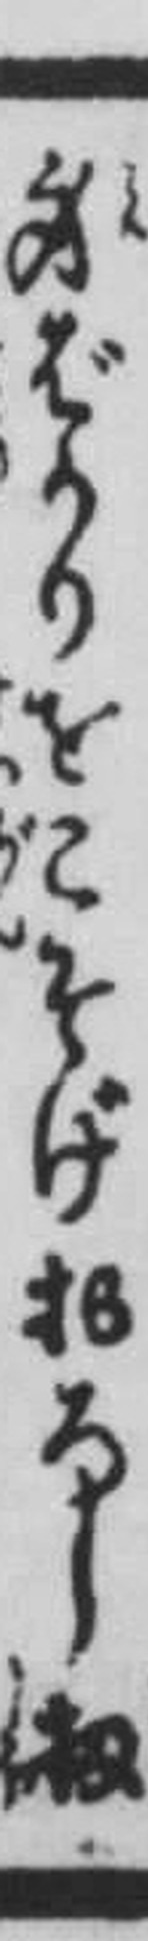身ばかりをこそげおろし扨
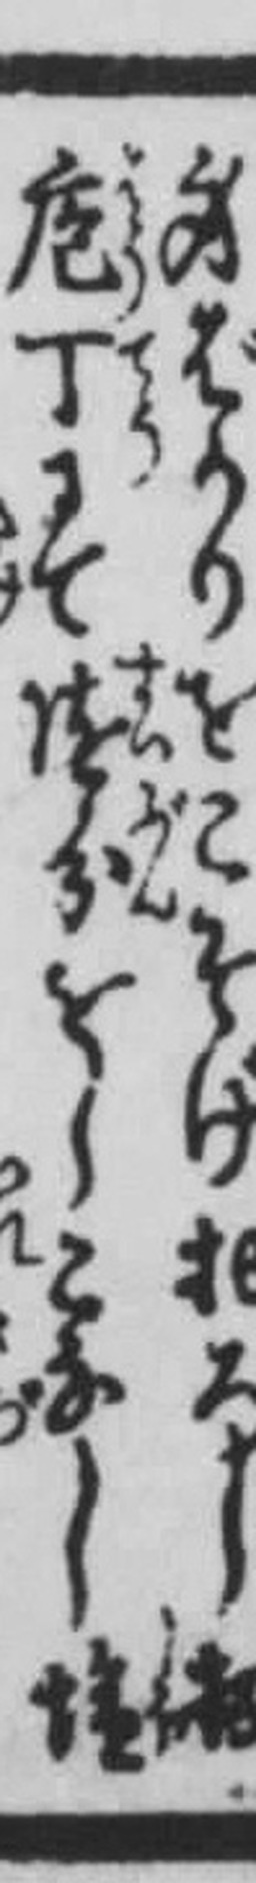庖丁にて随分をしこなし塩
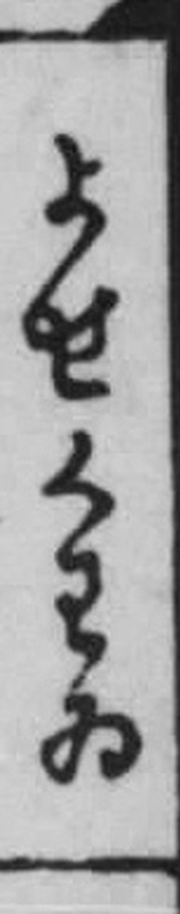よせくわゐ
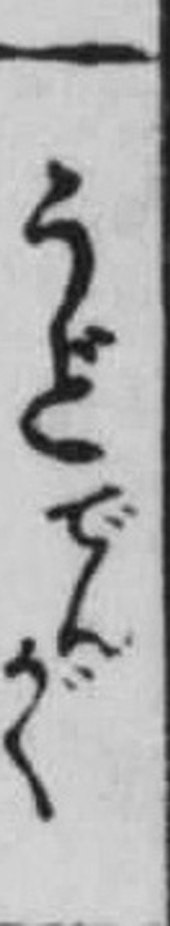うどでんがく
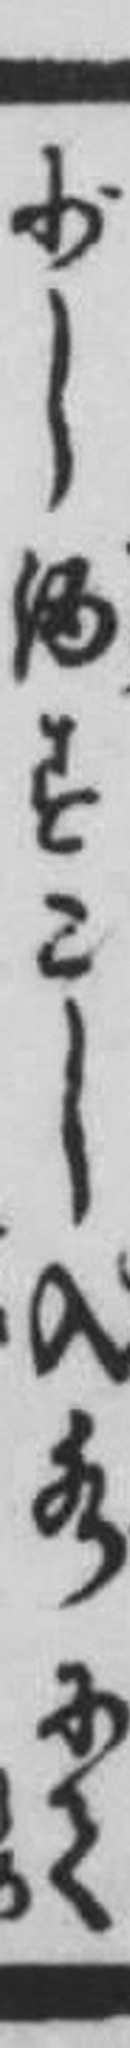少し酒すこし入水にて
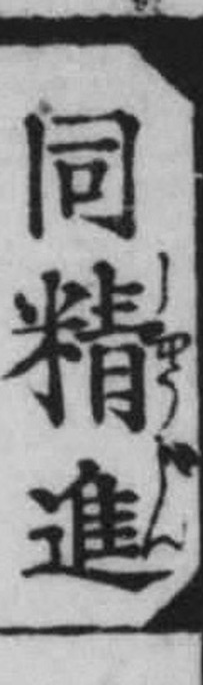同精進
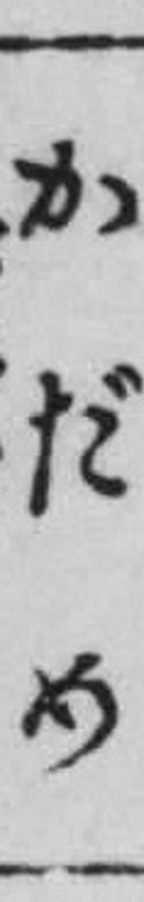かだめ
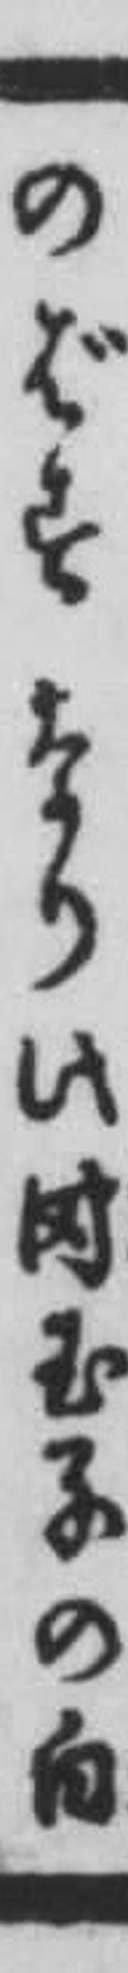のばすなり此時玉子の白
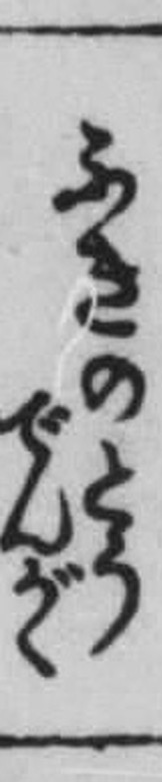ふきのとう
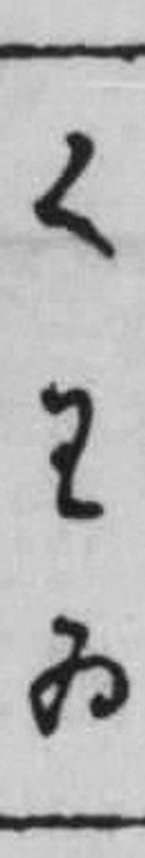くわゐ
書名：日用重宝魚類精進/料理早工風
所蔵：大阪府立大学学術情報センター 国文学研究資料館
